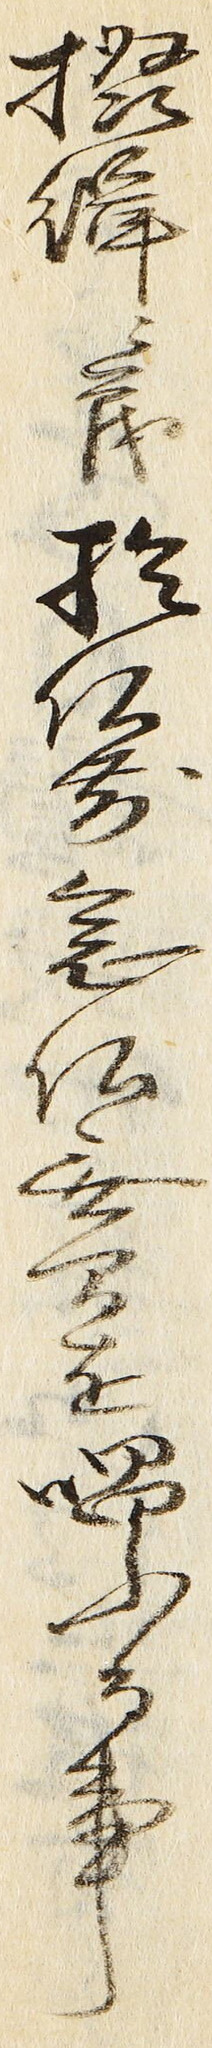撰緝にも於仏前念佛無間を唱ふる事
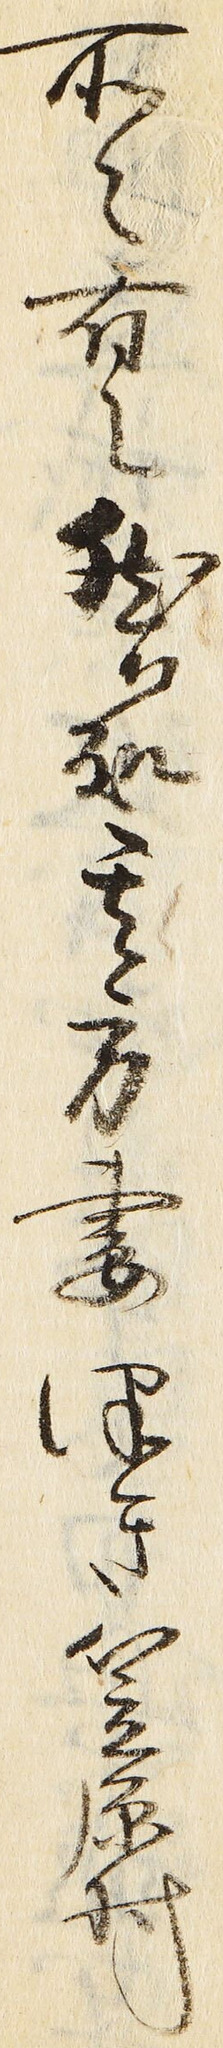所々有之然る処其方妻つき笠原村
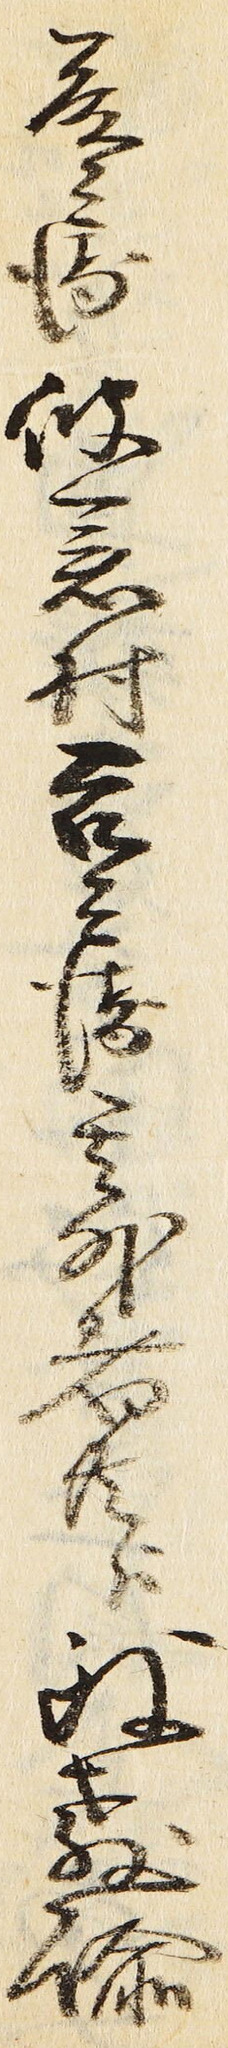藤兵衛彼倉村吉兵衛其外者共江致教諭
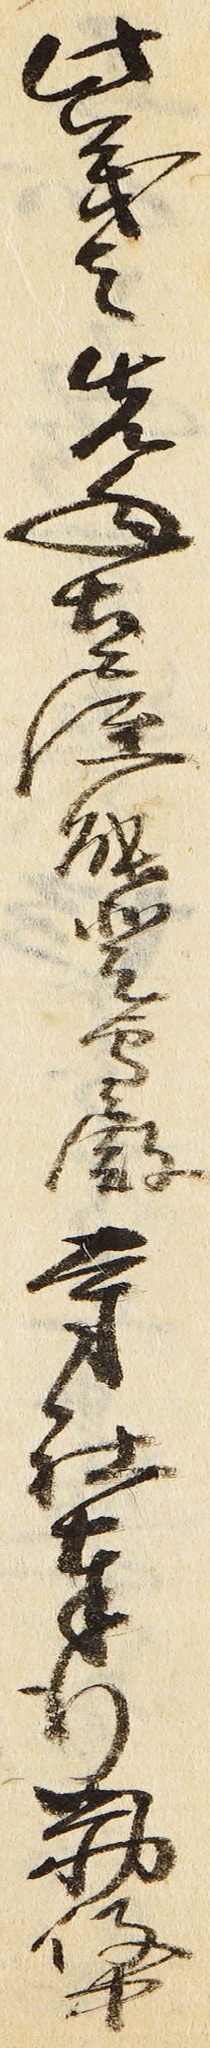此義は先年土屋能登守殿寺社奉行勤役中
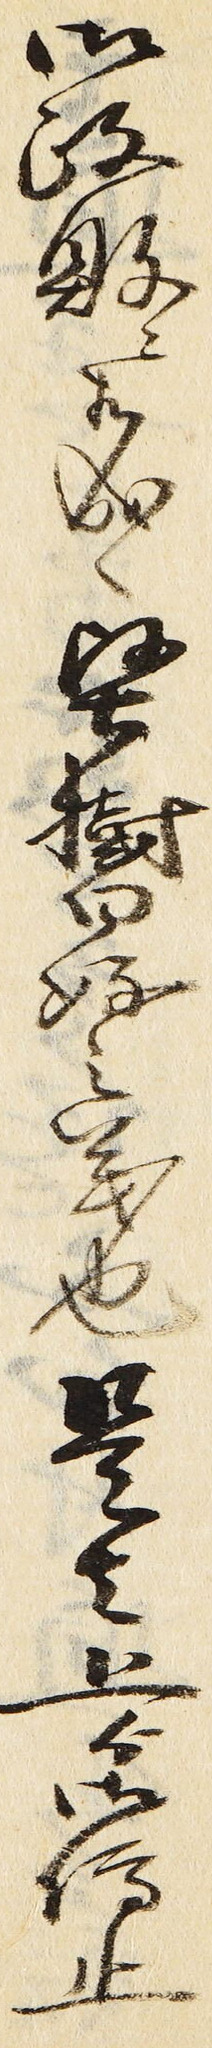御政敗に相成候堅樹日好之義也是は上ゟ御停止
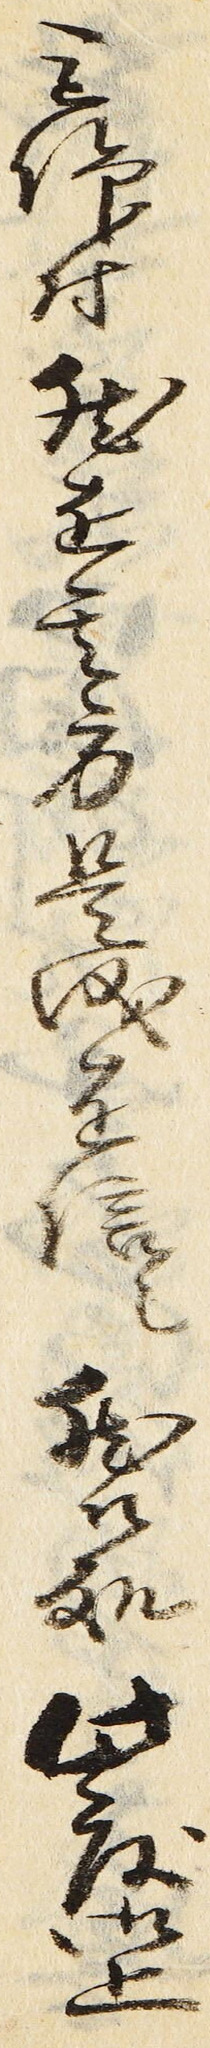被仰付然を其方是儀を信し然る処此度御上
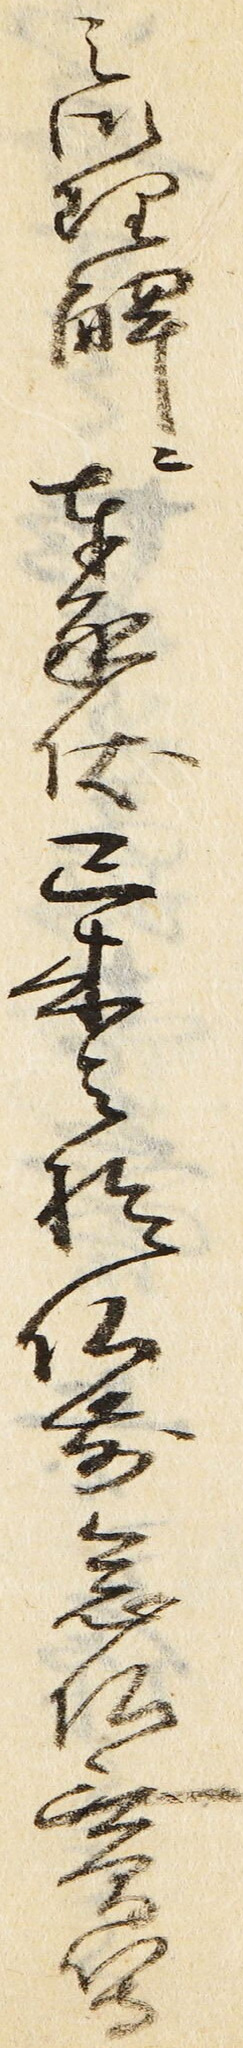之御理解に奉承伏已来は於仏前念佛無間等
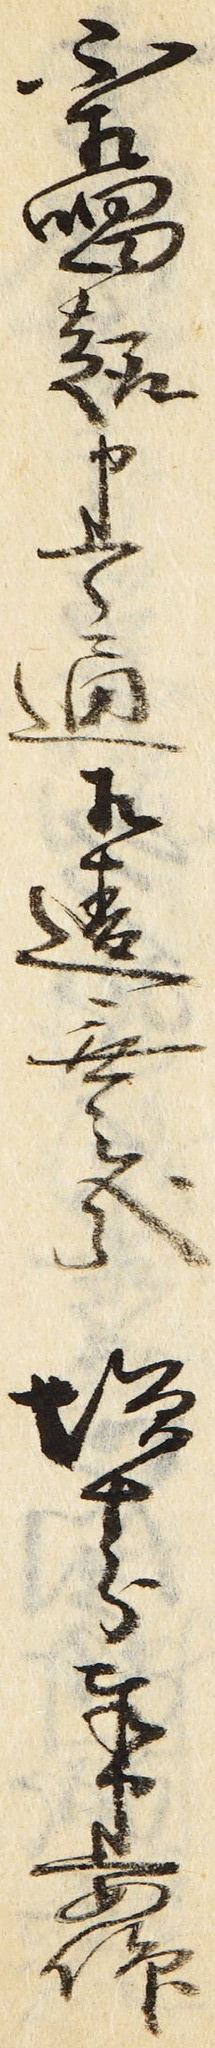不相唱趣申上候通相違無之哉増十郎奉申上如仰
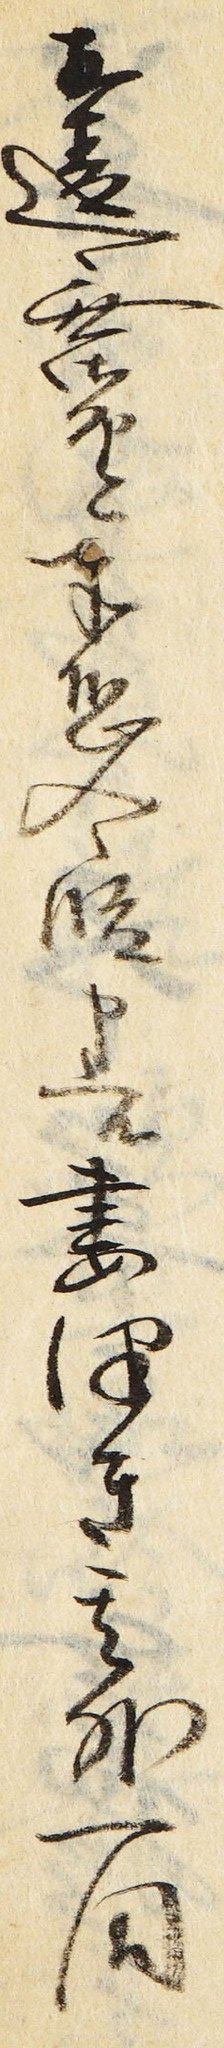相違無御座候奉恐入候段申上る妻つき其外一同

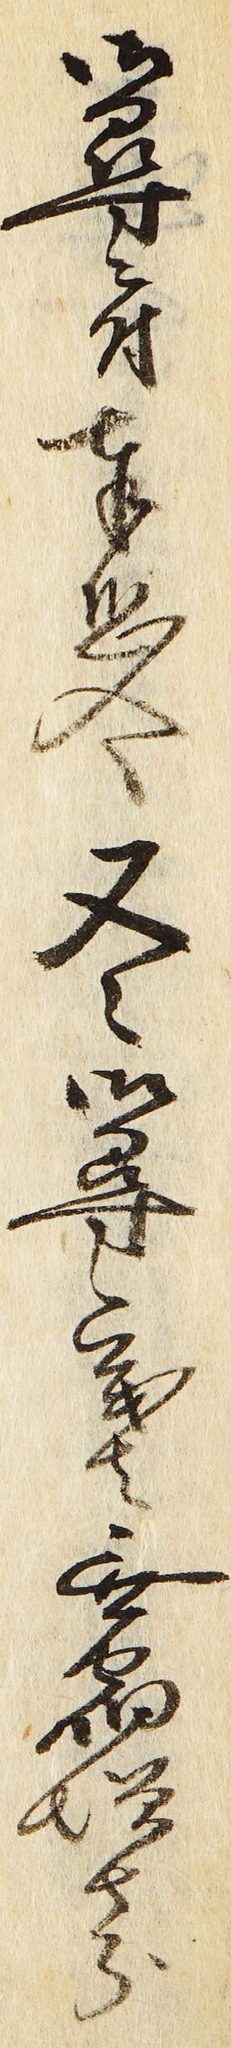御尋に付奉恐入候又之御尋候義は無宿増十郎
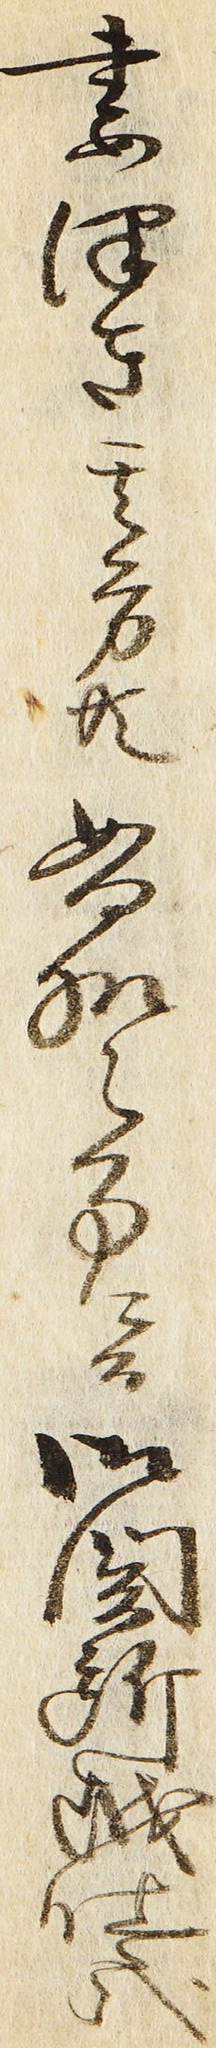妻つき其方共如何様之事にて御関所越仕候哉
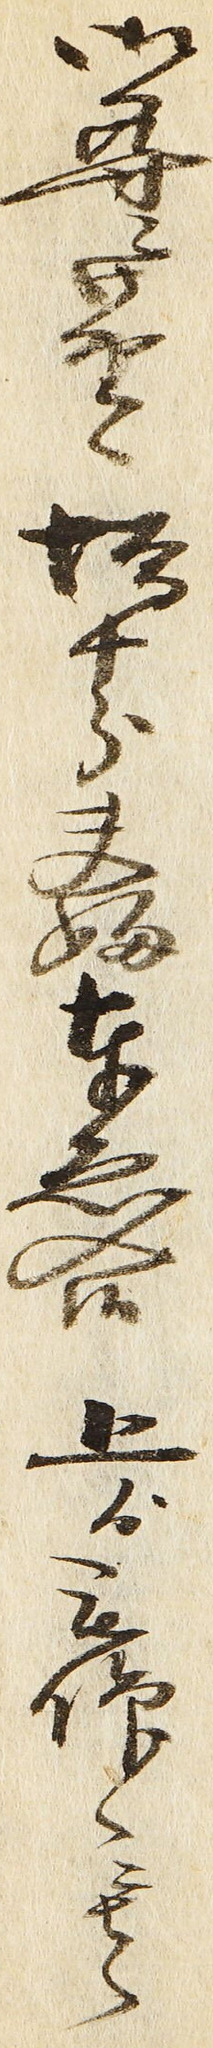御尋に御座候増十郎夫婦奉恐入候上ゟ被仰候には
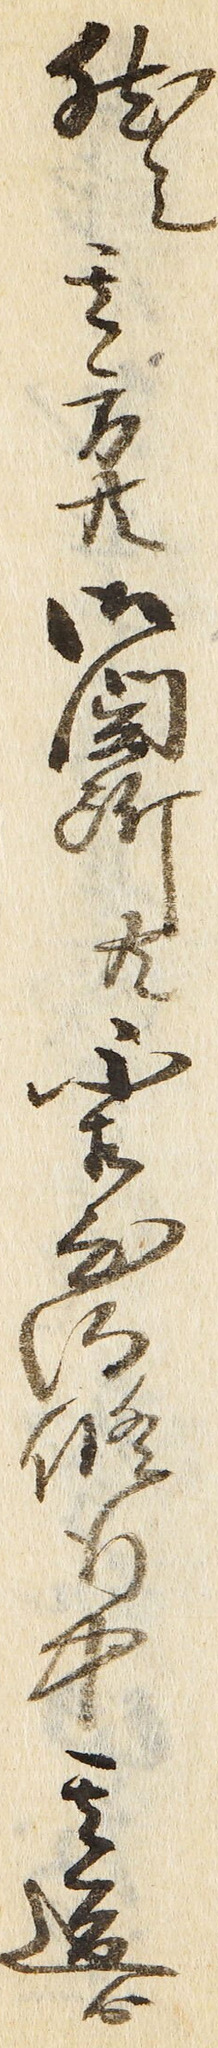然し其方共御関所共不相心得修行中其違ゟ
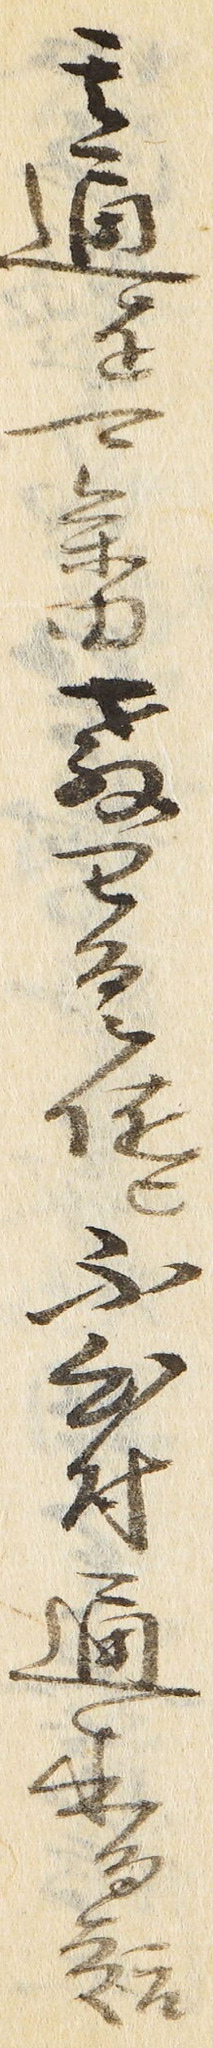其通を可参由教わるに随ひ不心付通来る趣
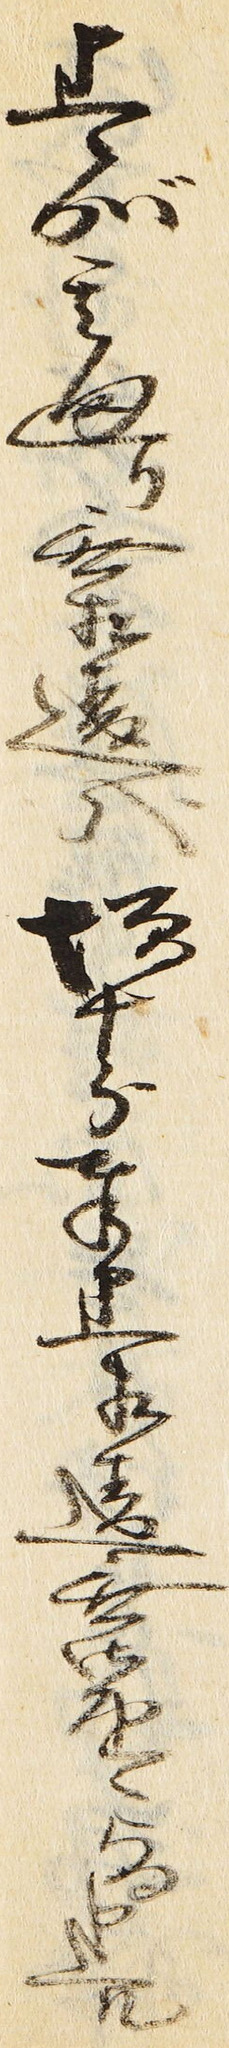申上候が其通り無相違哉増十郎奉申上相違無御座候と申上る
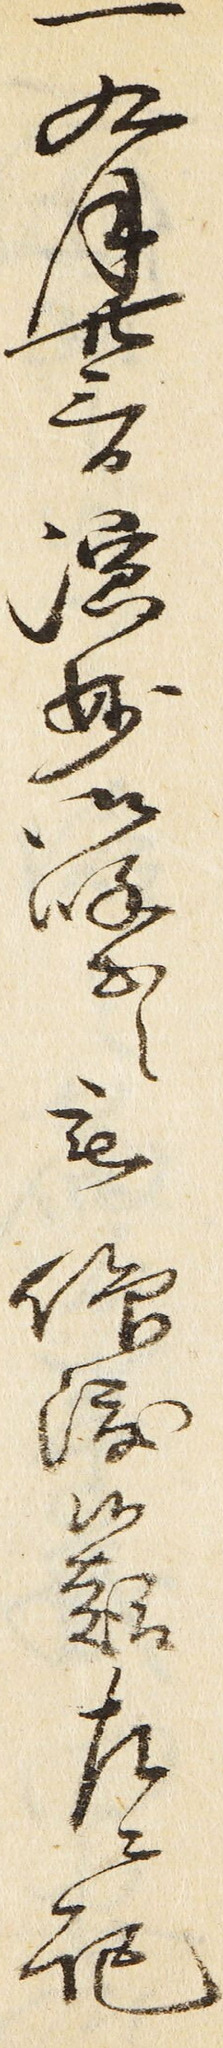一九月廿三日演妙御呼出し被仰渡候趣左に記
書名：異流一件日記
